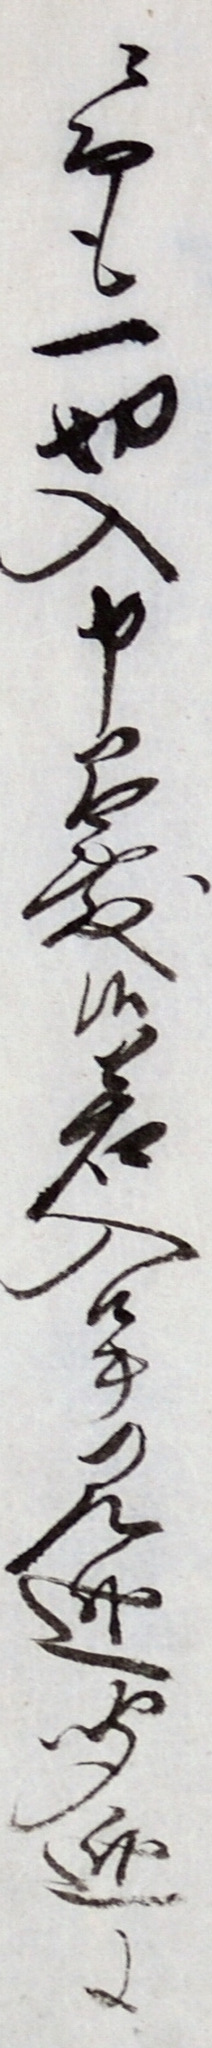ニ而も一切入申間敷候若入候ヲ見逃聞逃に
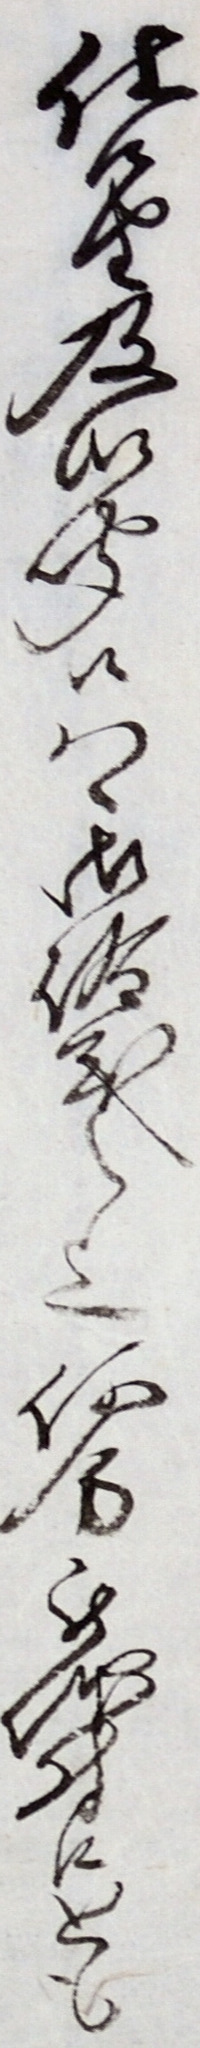仕候由及御聞候ハヽ御詮義之上何分被仰付候とも
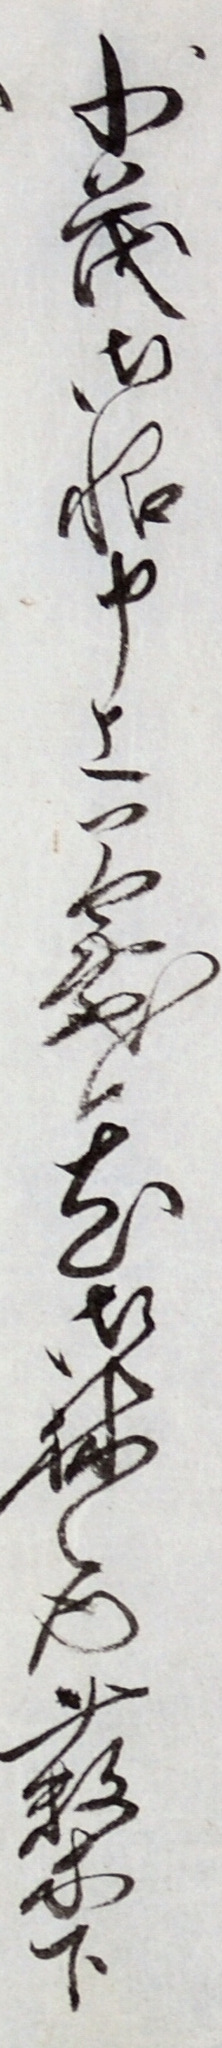少も御恨申上間敷候尤御林之内薮木下
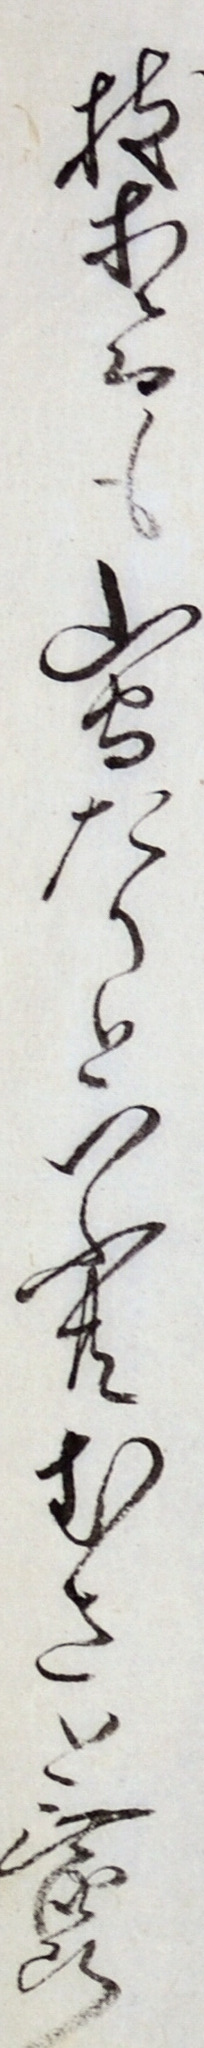枝等ニ而も山守たりといふ共むさと無御断

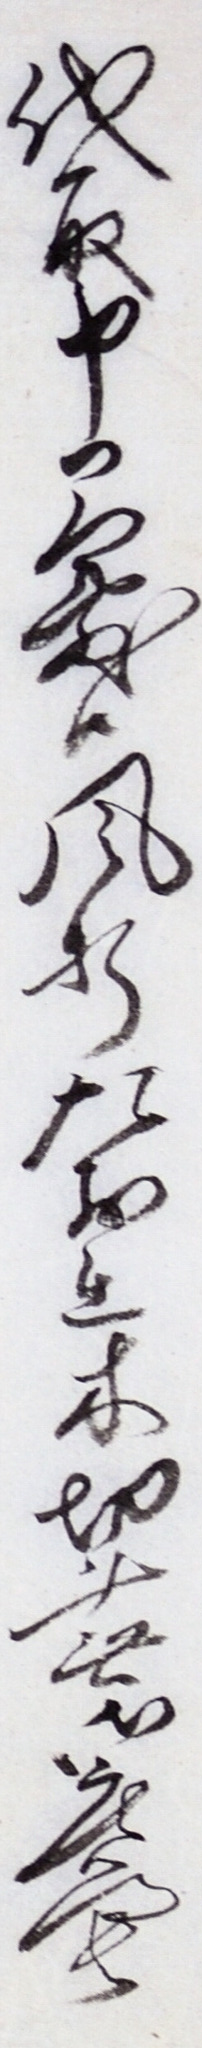伐取申間敷候風折たおれ木切蕪御座候得は
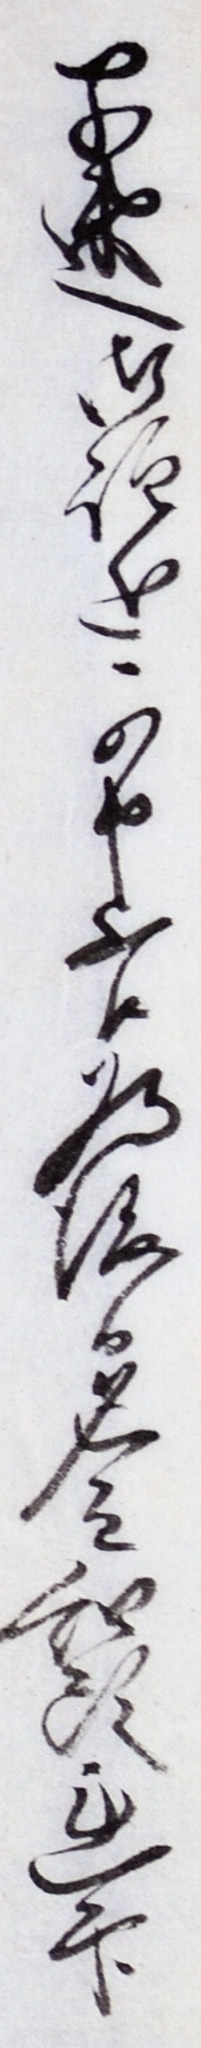早速御註進可申上候為後日名主組頭連印
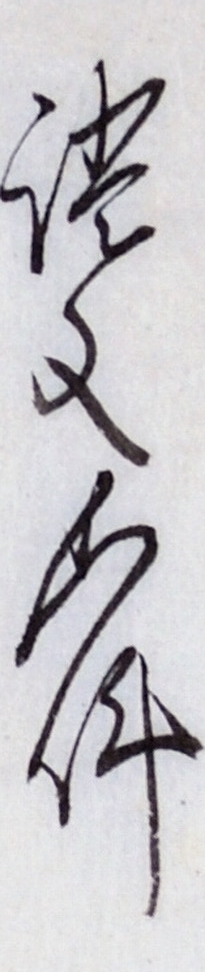証文如件
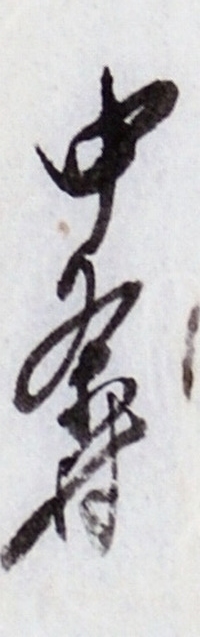中条村
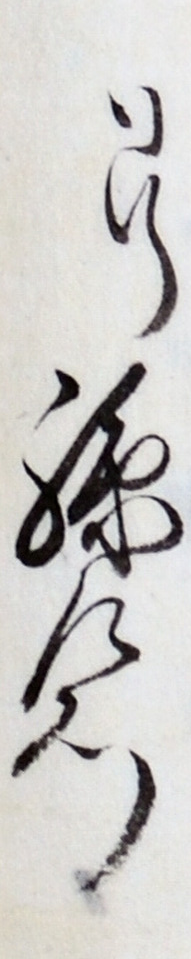同断孫左衛門
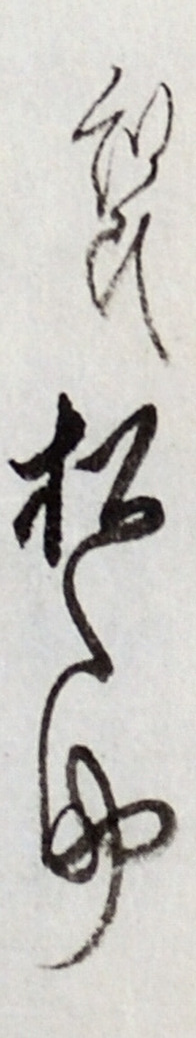組頭松之助
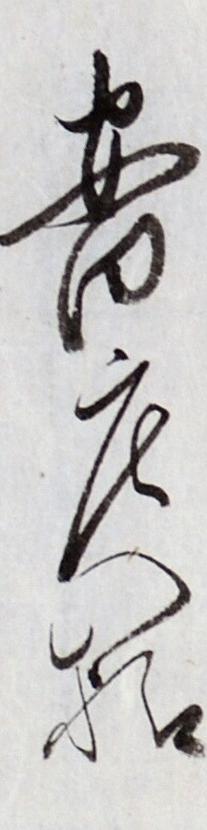安田庄八様
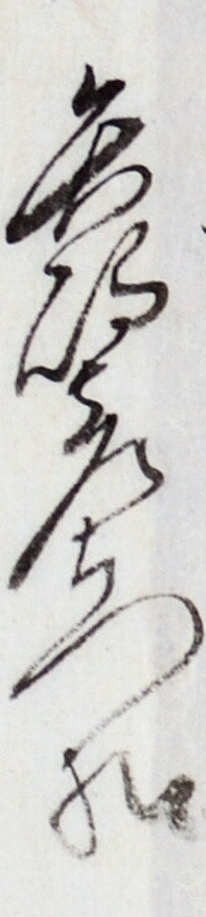矢嶋彦右衛門様

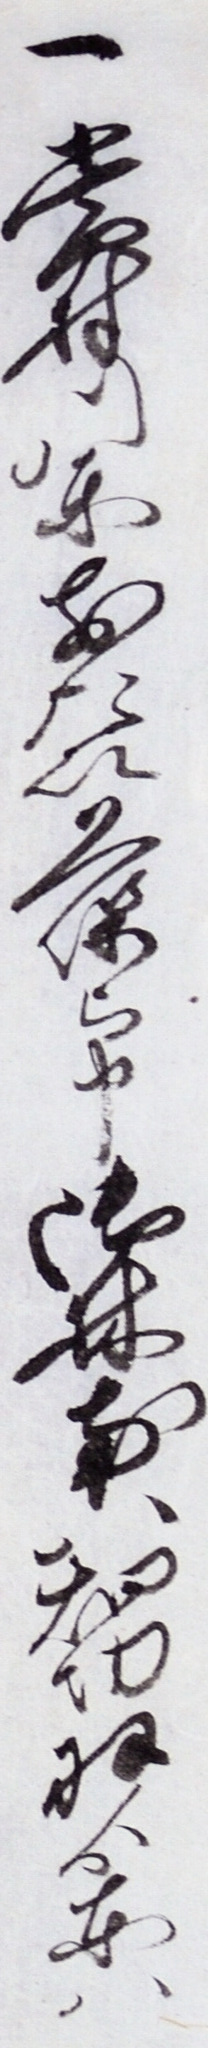一当村川原おたい久保与申御林南ハ畑切羽ゟ東ハ
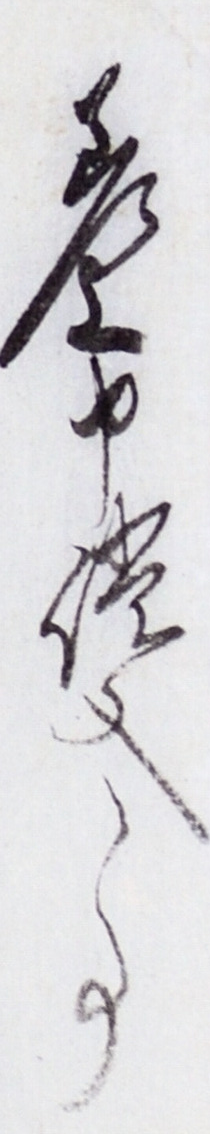差上申証文之事
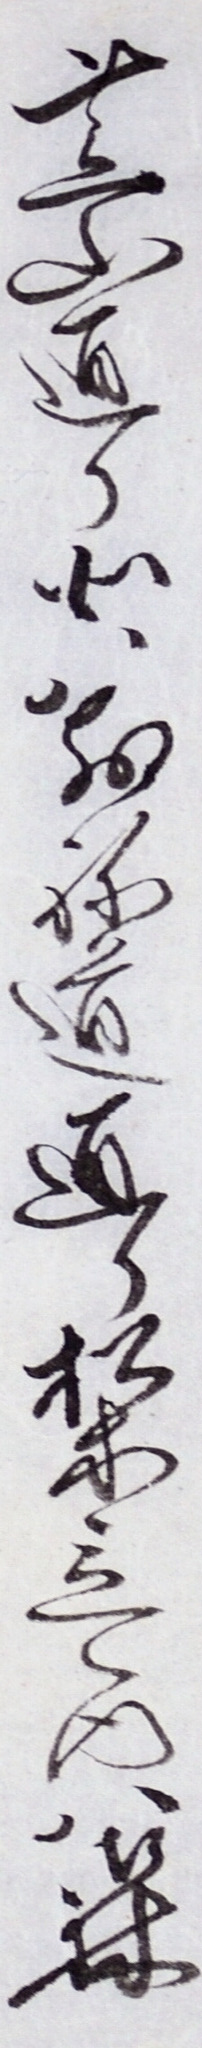山通り北ハおね道通り松木立之内ハ御林
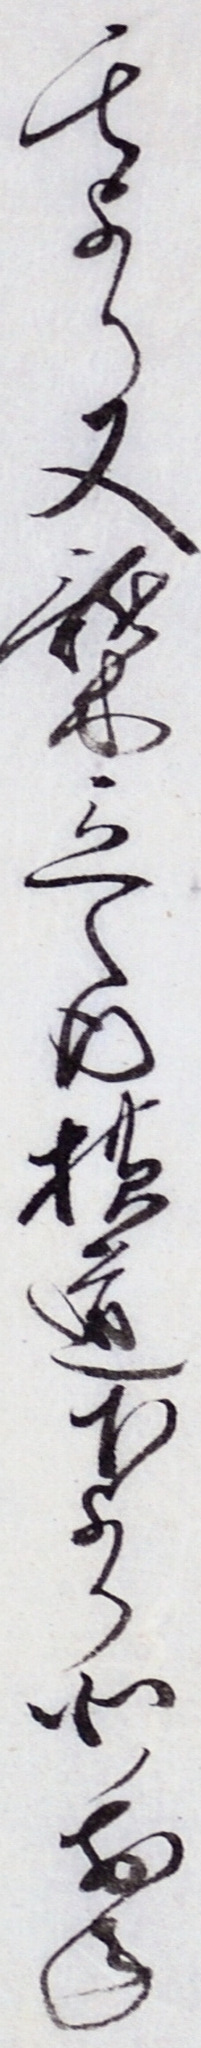其より又雑木立之内横道下より北ノおね
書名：御林御竹藪証文控
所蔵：伊那市立高遠町図書館・合同会社AMANE
